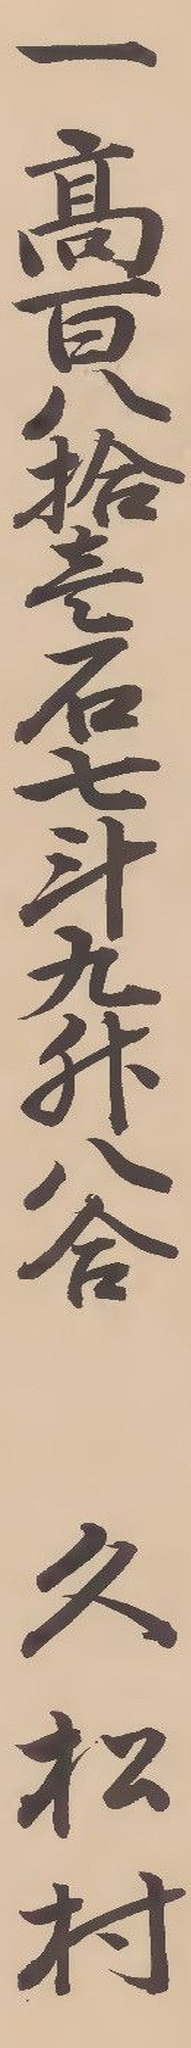一高百八拾壱石七斗九升八合久松村
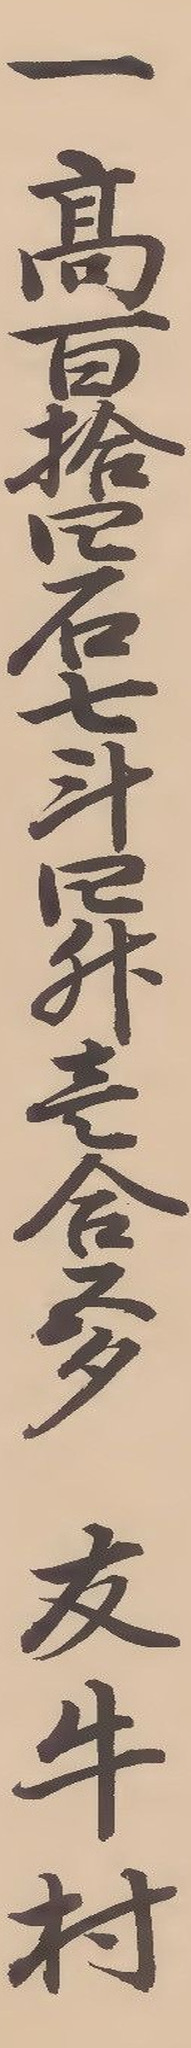一高百拾四石七斗四升壱合五勺友牛村
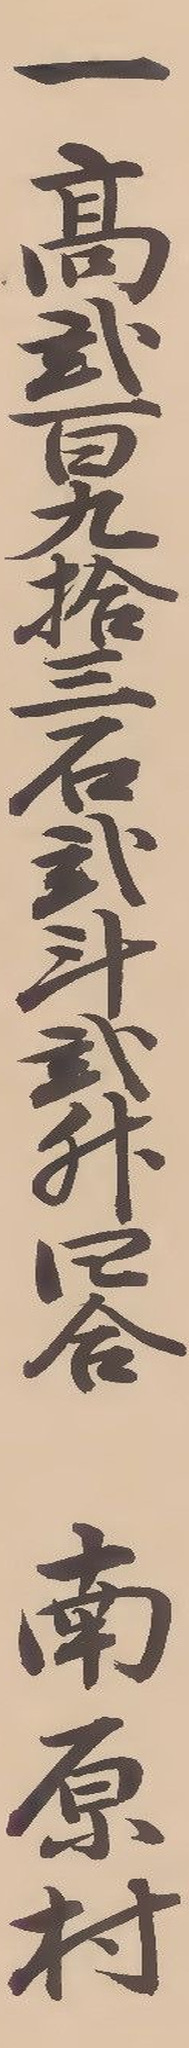一高弐百九拾三石弐斗弐升四合南原村
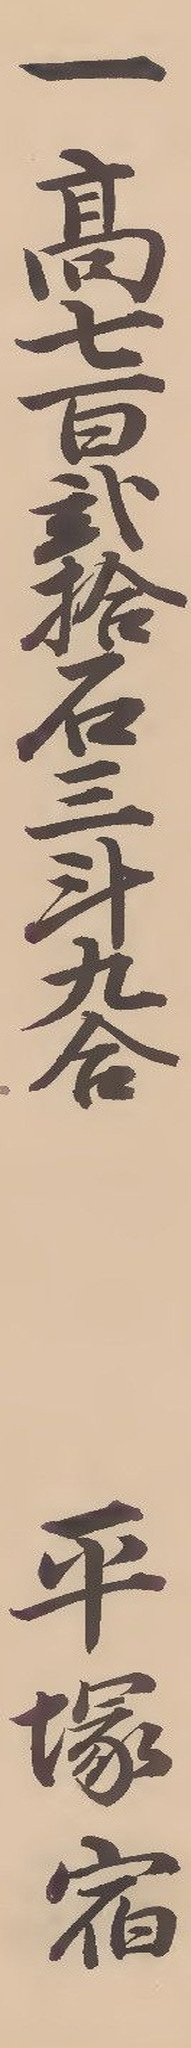一高七百弐拾石三斗九合平塚宿

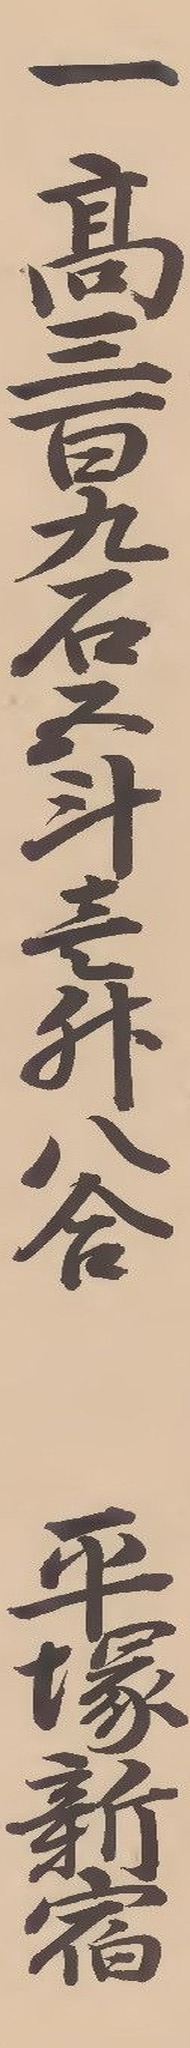一高三百九石五斗壱升八合平塚新宿
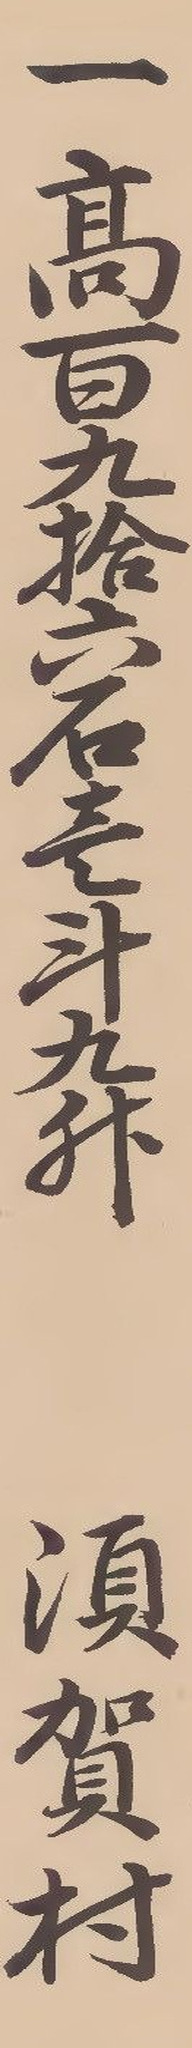一高百九拾六石壱斗九升須賀村
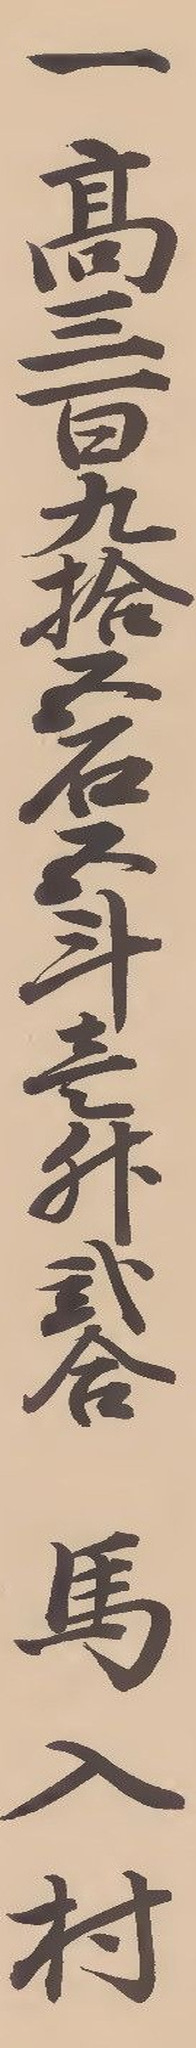一高三百九拾五石五斗壱升弐合馬入村
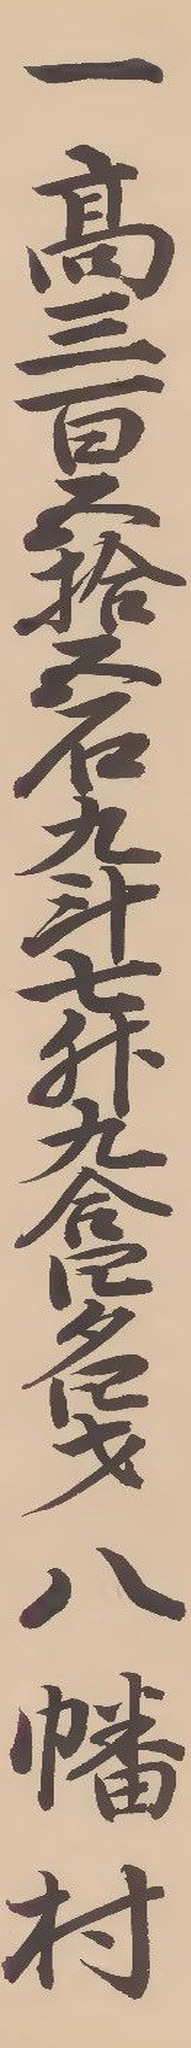一高三百五拾五石九斗七升九合四勺四才八幡村
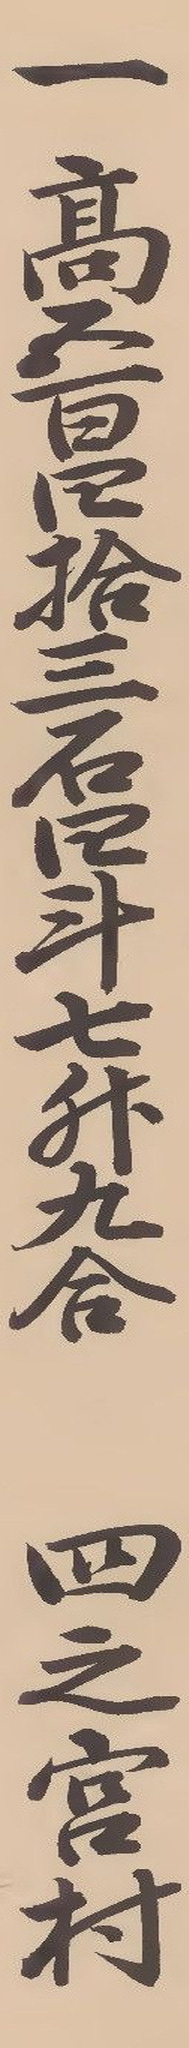一高五百四拾三石四斗七升九合四之宮村
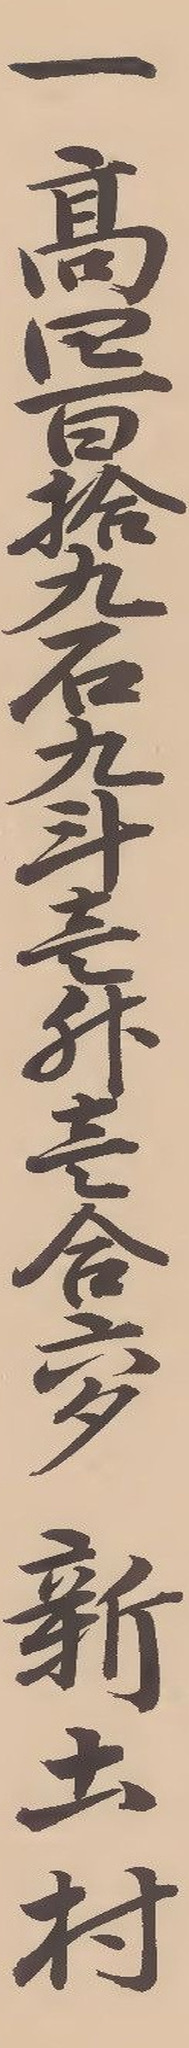一高四百拾九石九斗壱升壱合六勺新土村
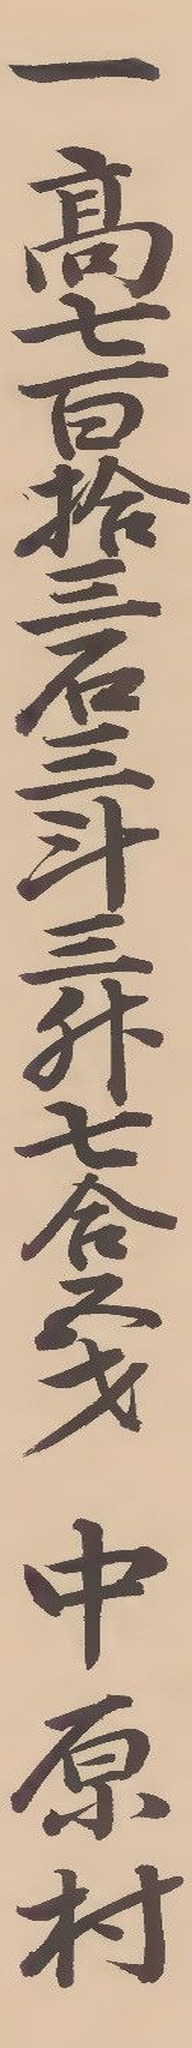一高七百拾三石三斗三升七合五才中原村
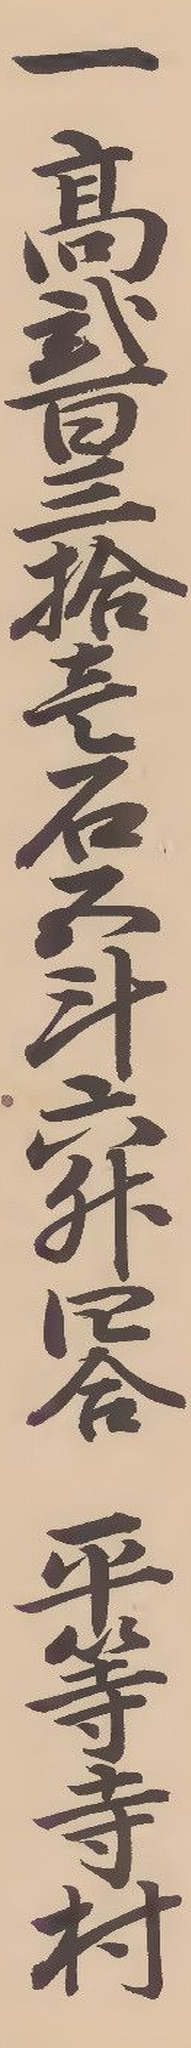一高弐百三拾壱石五斗六升四合平等寺村

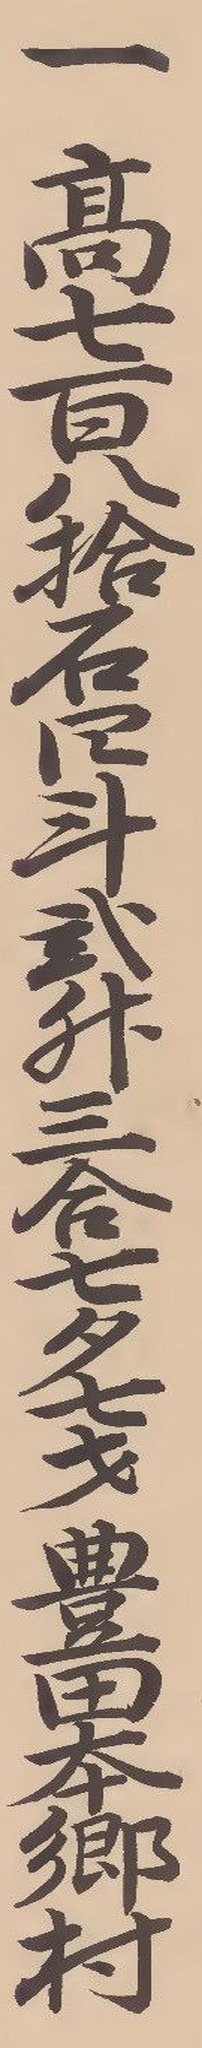一高七百八拾石四斗弐升三合七勺七才豊田本郷村
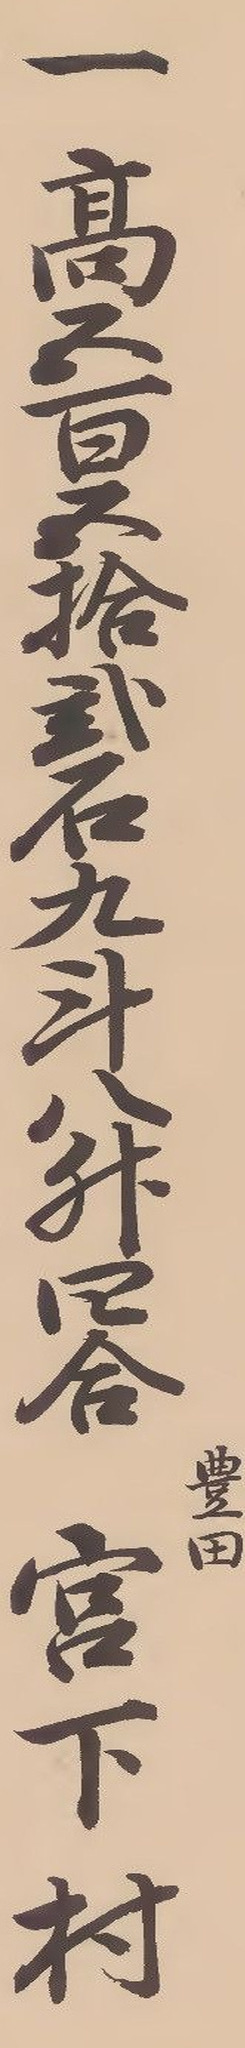一高五百五拾弐石九斗八升四合宮下村
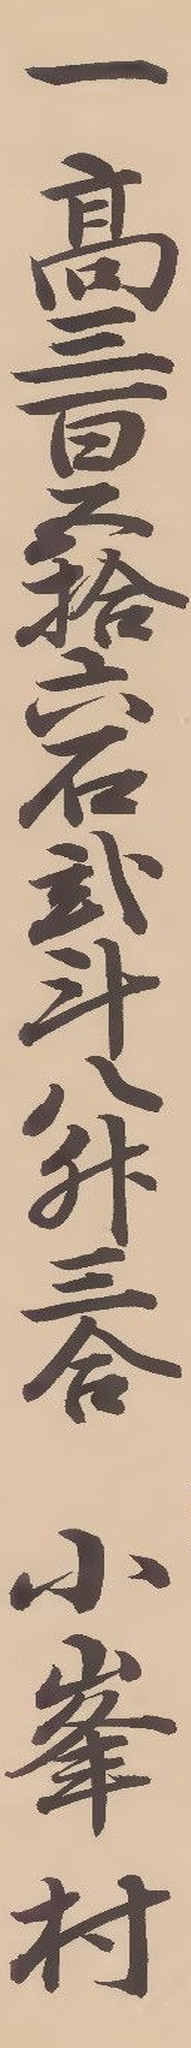一高三百五拾六石弐斗八升三合小峯村
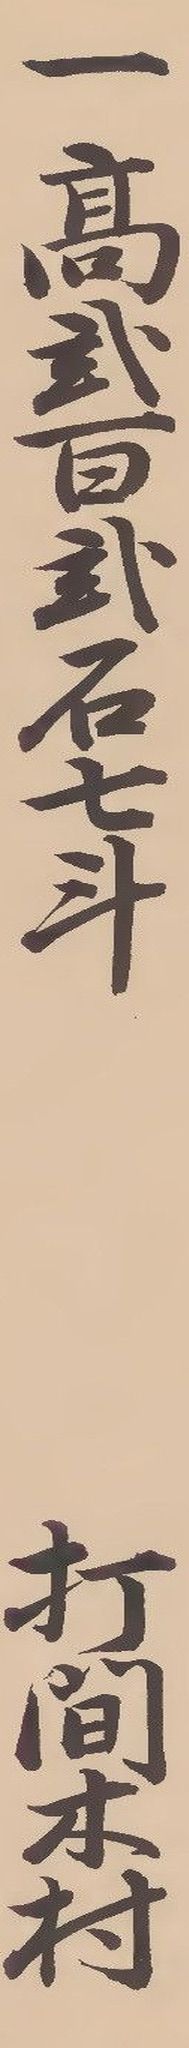一高弐百弐石七斗打間木村
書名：相模国郷帳
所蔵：国立公文書館 National Archives of Japan
